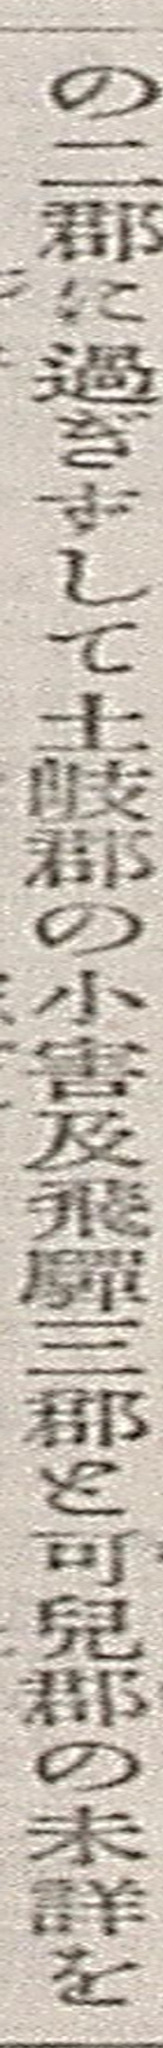の二郡に過ぎずして土岐郡の小害及飛騨三郡と加兒郡の未詳を
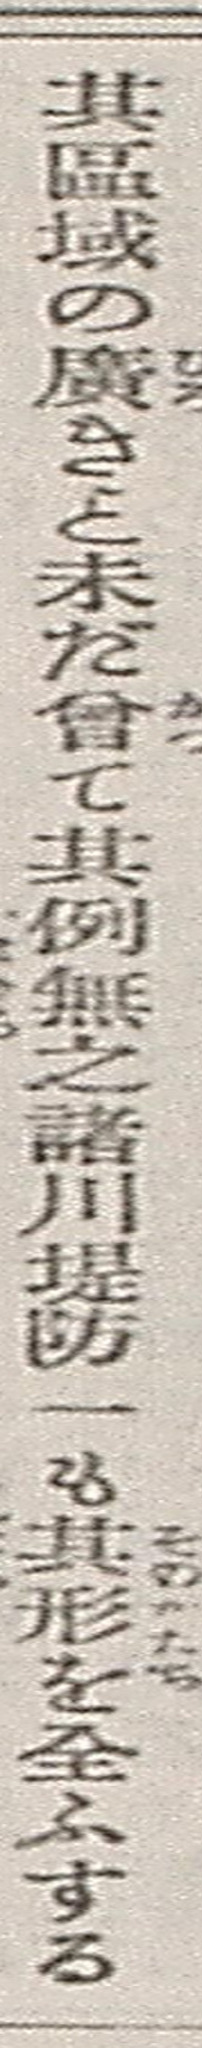其區域の廣きこと未だ曾て其例無之諸川堤防一も其形を全ふする
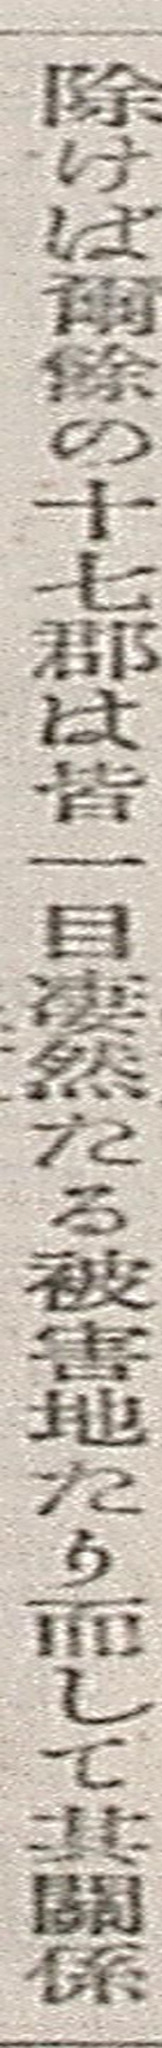除けば爾餘の十七郡は皆一目凄然たる被害地たり而して其關係
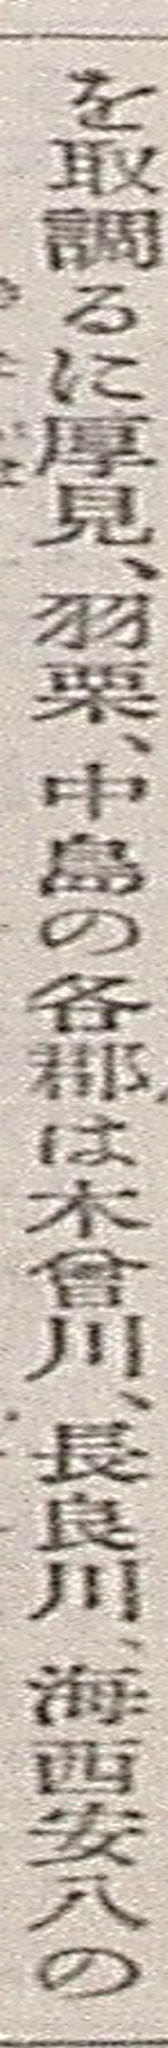を取調るに厚見、羽栗、中島の各郡は木曽川、長良川、海西安八の
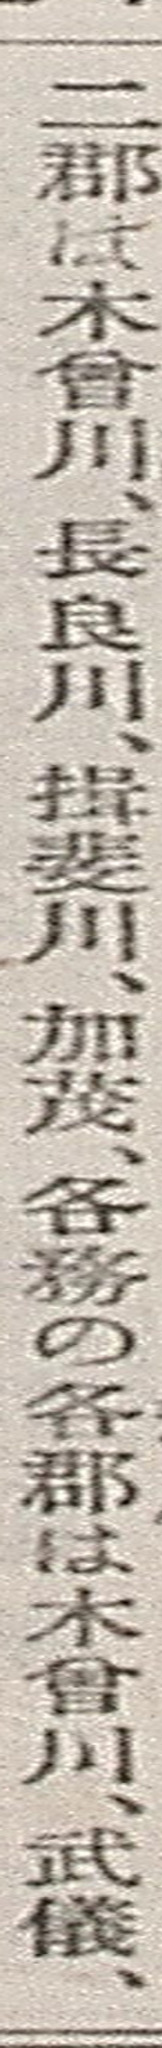二郡は木曽川、長良川、揖斐川、加茂、各務の各郡は木曽川、武儀、
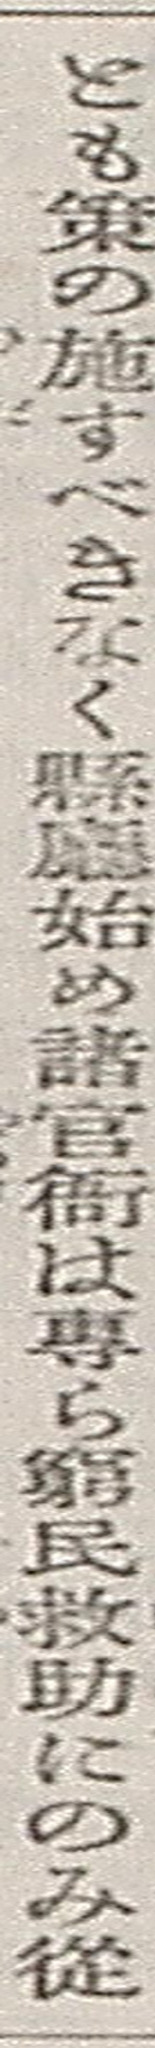とも策の施すべきなく県庁始め諸官衛は専ら窮民救助にのみ従
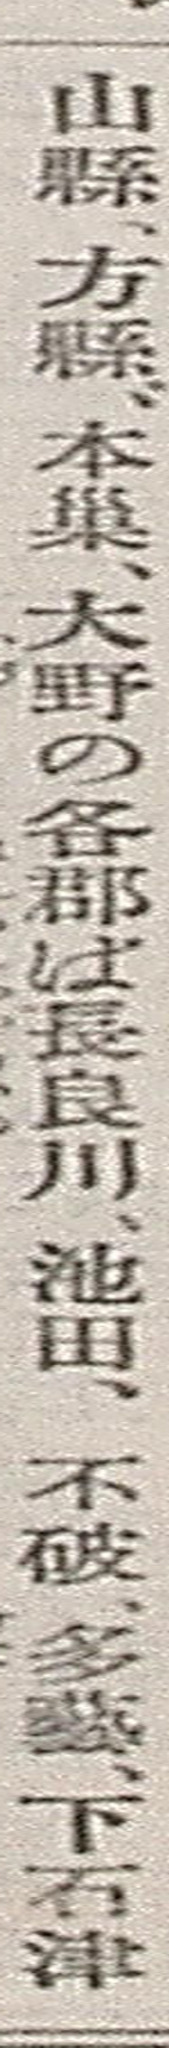山縣、方縣、木巣、大野の各郡は長良川、池田、不破、多芸、下石津
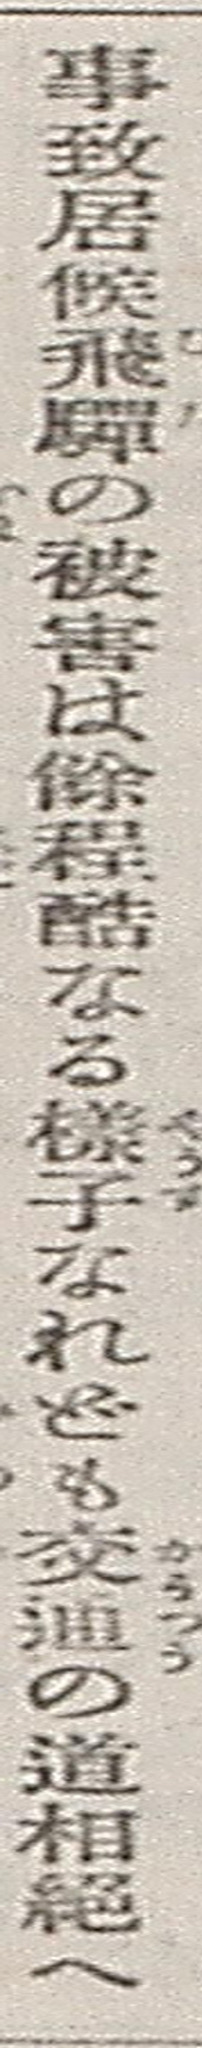事致居候飛騨の被害は餘程酷なる様子なれども交通の道相絶へ
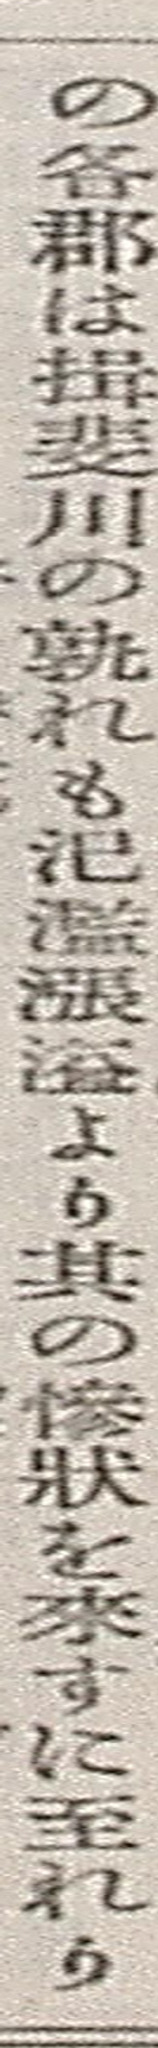の各郡は揖斐川の孰れも氾濫漲溢より其の惨状を来すに至れり
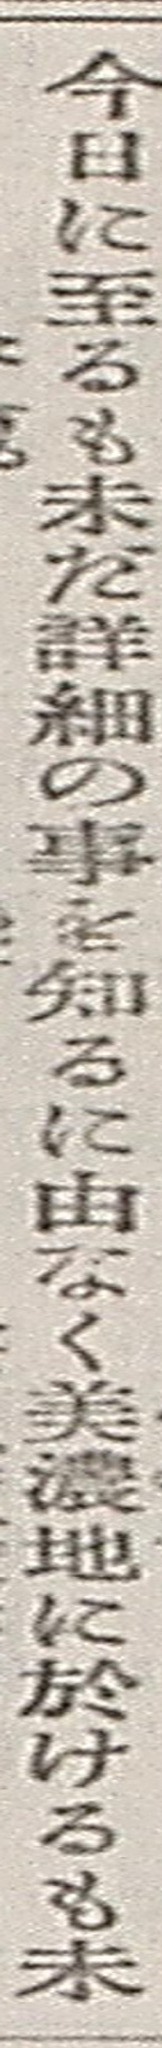今日に至るも未だ詳細の事を知るに由なく美濃地に於けるも未
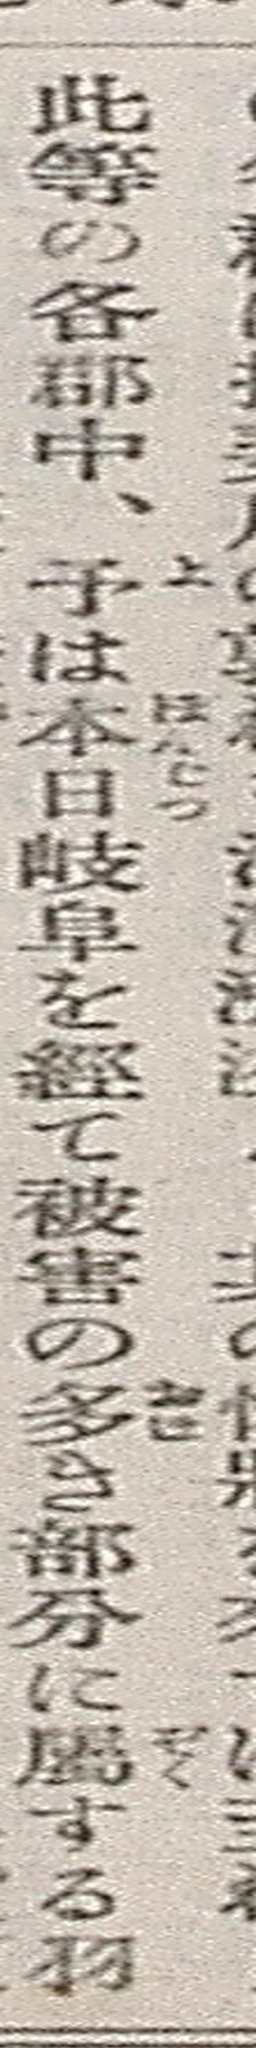此等の各郡中、予は本日岐阜を経て被害の多き部分に属する羽
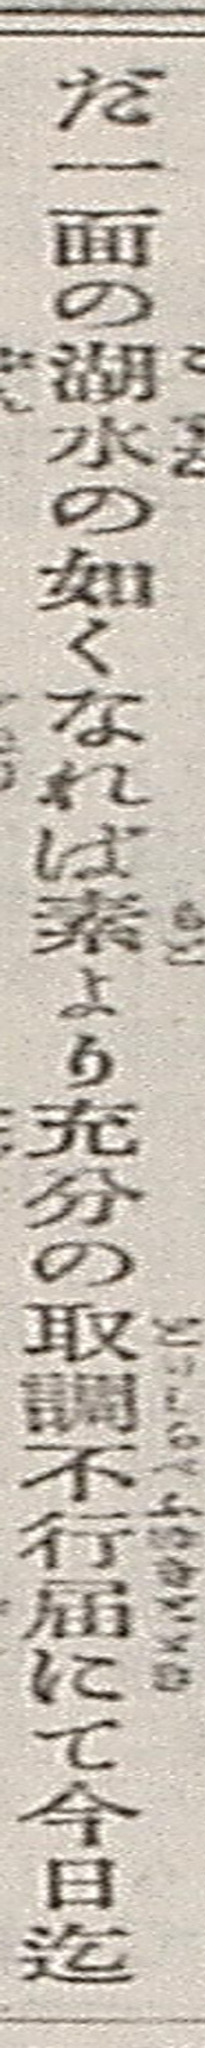だ一面の湖水の如くならば素より充分の取調不行届にて今日迄
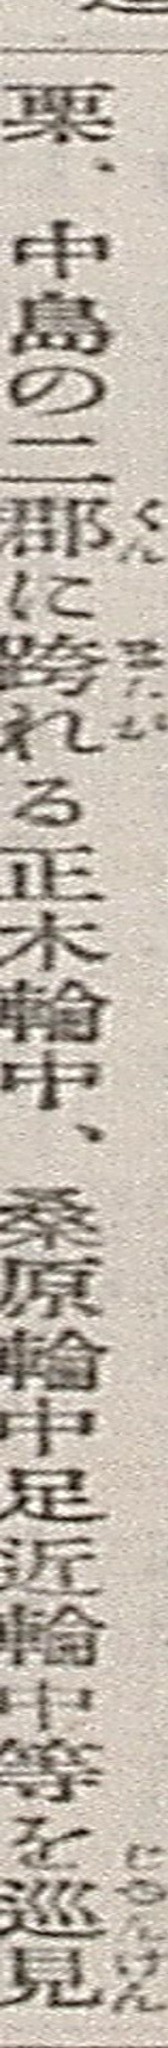栗、中島の二郡に跨れる正木輪中、桑原輪中足近輪中等を巡見
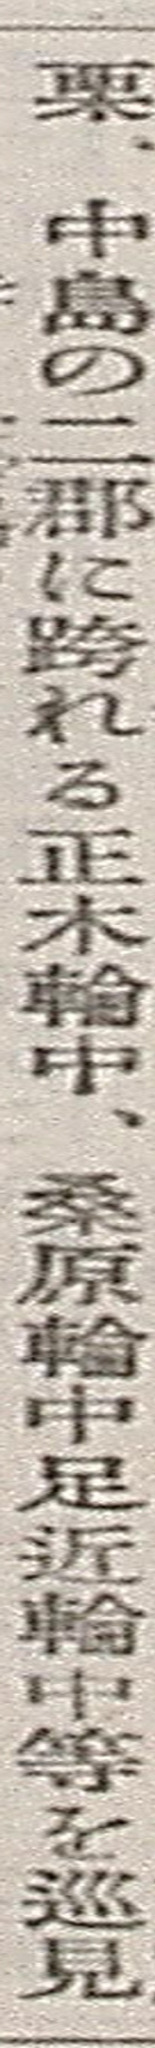栗、中島の二郡に跨れる正木輪中、桑原輪中足近輪中等を巡見
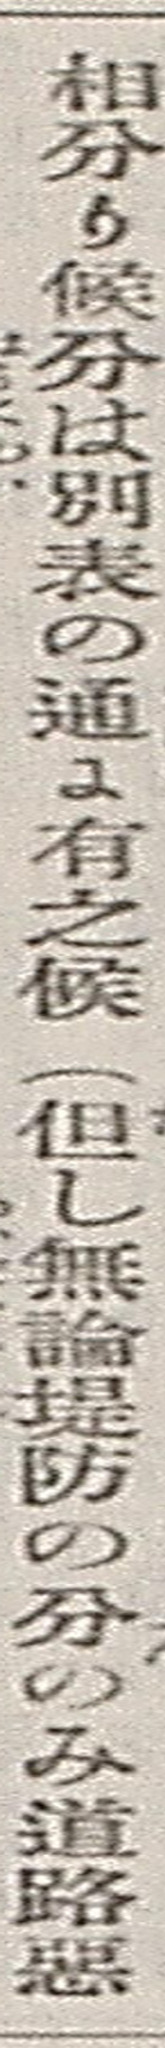相分り候分は別表の通に有之候し無論堤防の分のみ道路悪
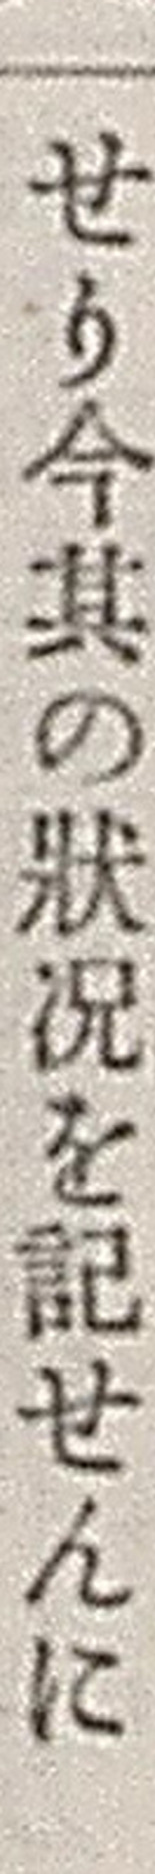せり今其の状況を記せんに
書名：風俗畫報臨時増刊第百二十六號　洪水被害録（中）
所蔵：東京大学地震研究所図書室 Earthquake Research Institute Library, The University of Tokyo, JAPAN
